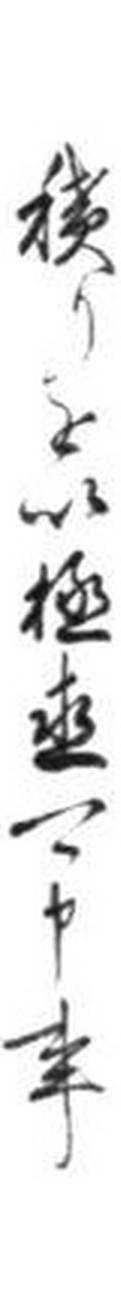積りを以極直可申事
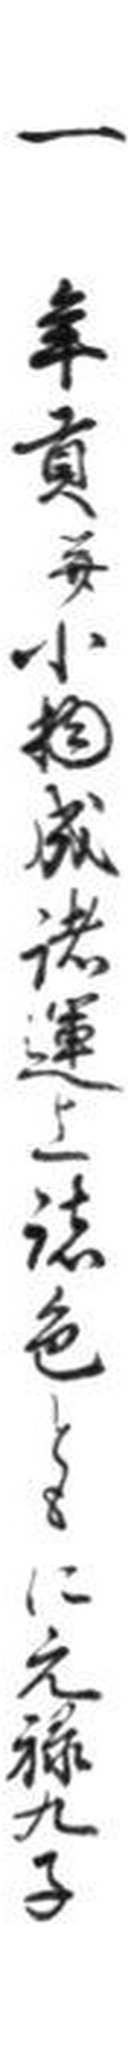一年貢并小物成諸運上諸色ともに元禄九子
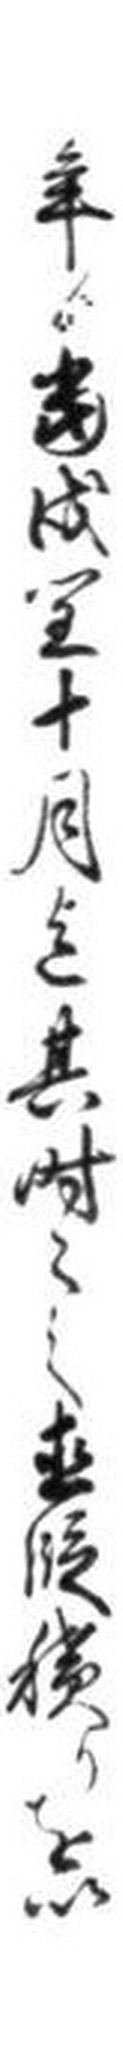年ゟ当戌閏十月迄其時々之直段積りを以
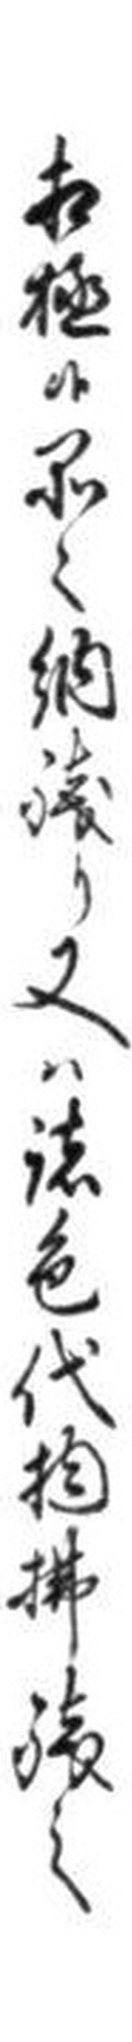相極候品々納残り又ハ諸色代物払残之
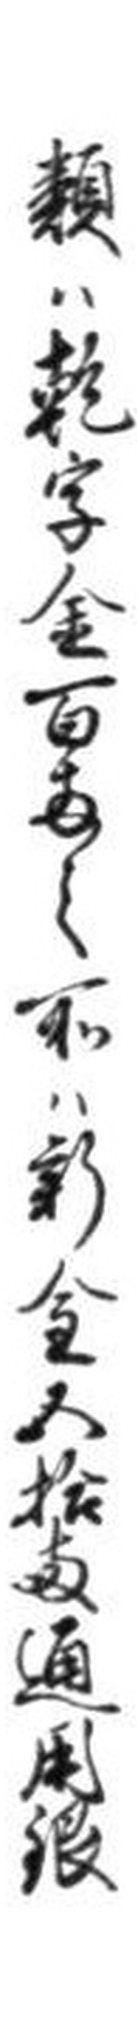類ハ乾字金百両之所ハ新金五拾両通用銀
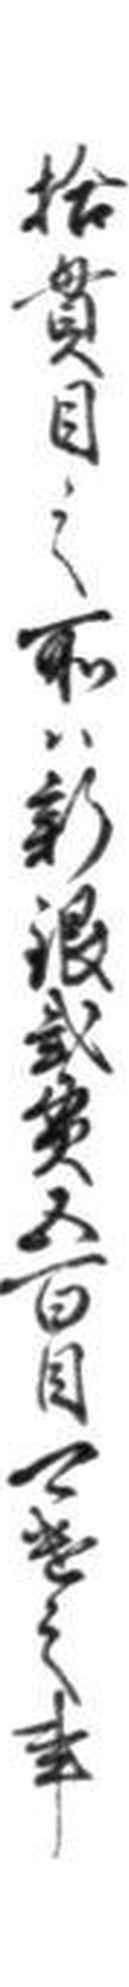拾貫目之所ハ新銀弐貫五百目可遣之事
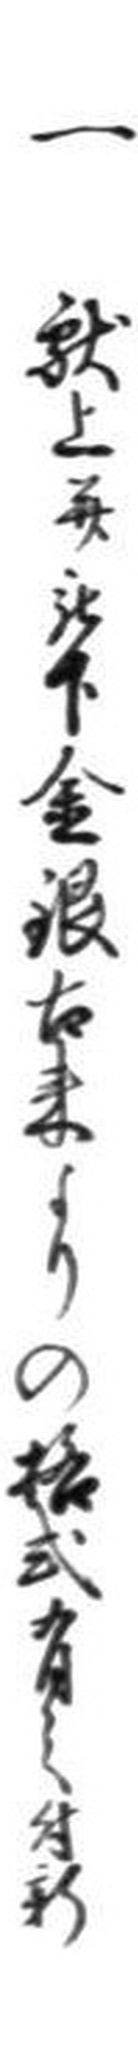一献上并被下金銀古来よりの格式有之付新
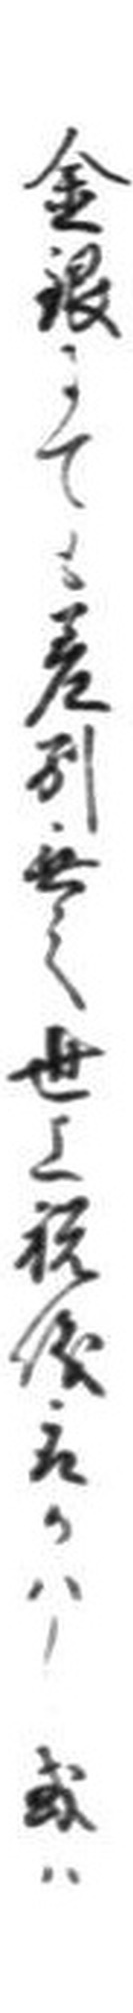金銀にても差別無之世上祝儀取かハし或ハ
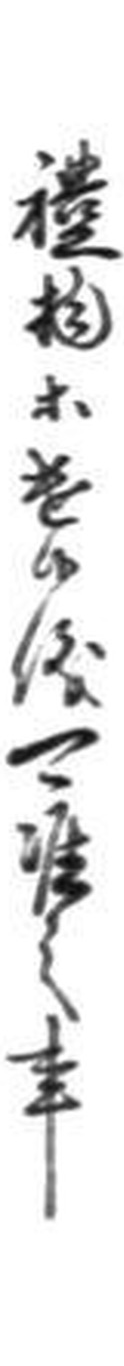礼物等遣候儀可准之事
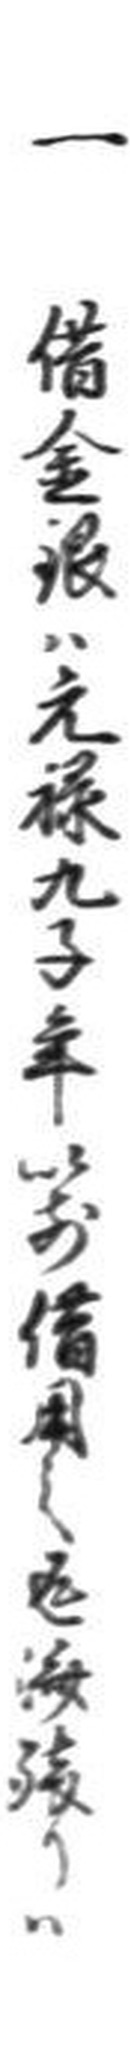一借金銀ハ元禄九子年以前借用之返済残りハ
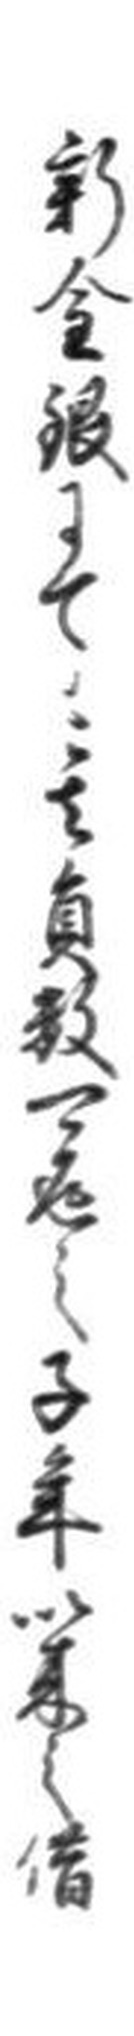新金銀にても其員数可返之子年以来之借
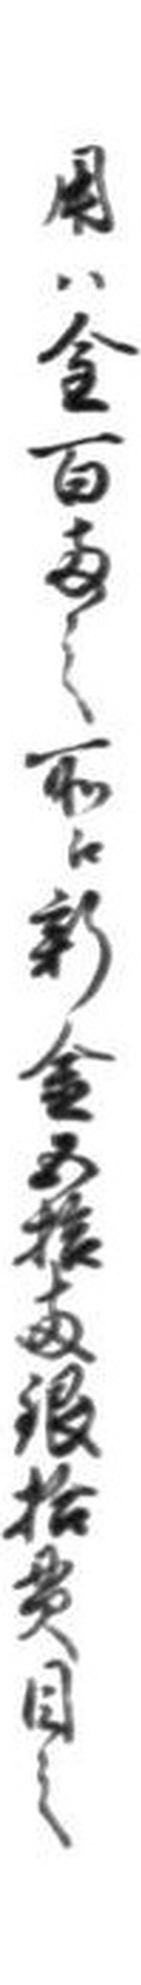用ハ金百両之所江新金五拾両銀拾貫目之
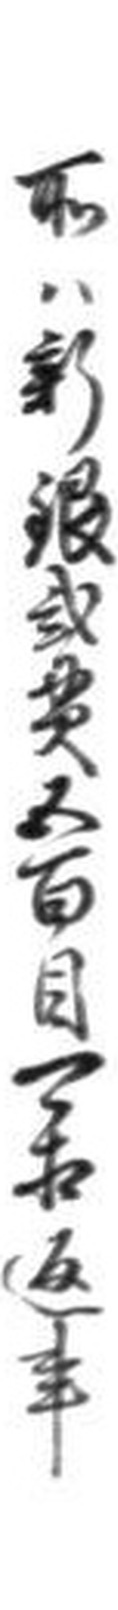所ハ新銀弐貫五百目可相返事
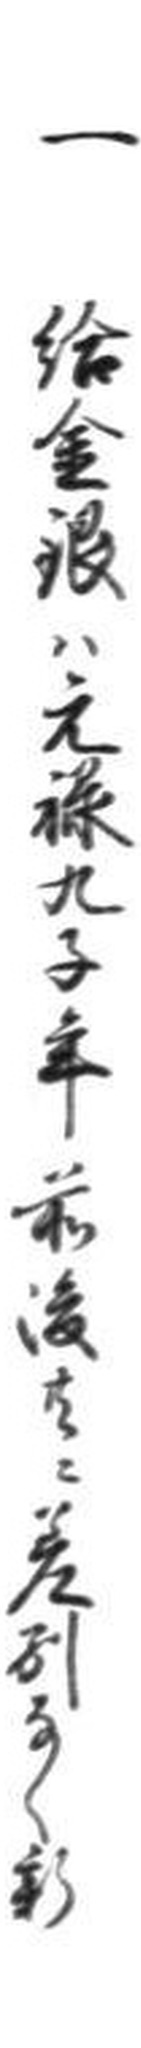一給金銀ハ元禄九子年前後共ニ差別なく新
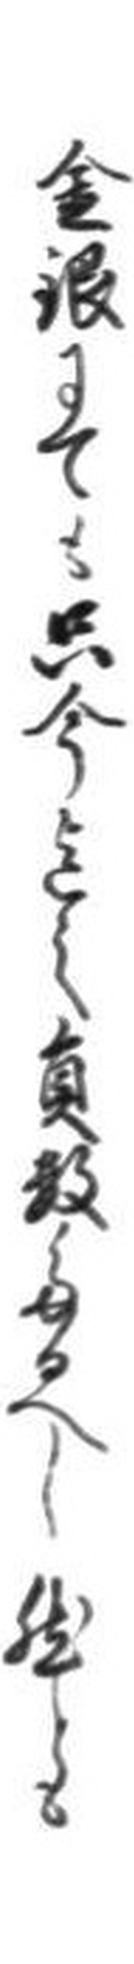金銀にても只今迄之員数たるへし然とも

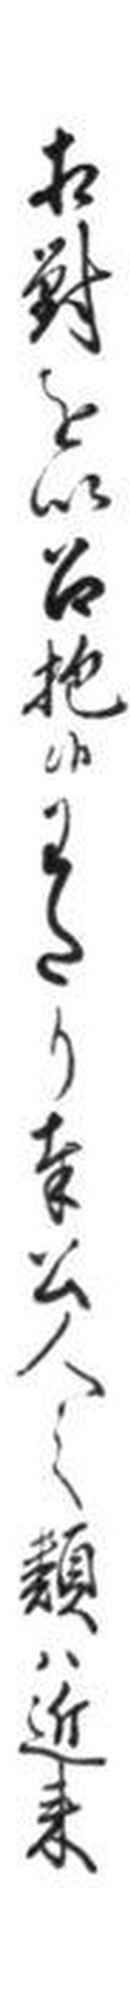相対を以召抱候わたり奉公人之類ハ近来
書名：家譜 三十二 吉邦公 従享保二年到享保三年
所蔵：福井県文書館 Fukui Prefectural Archives
